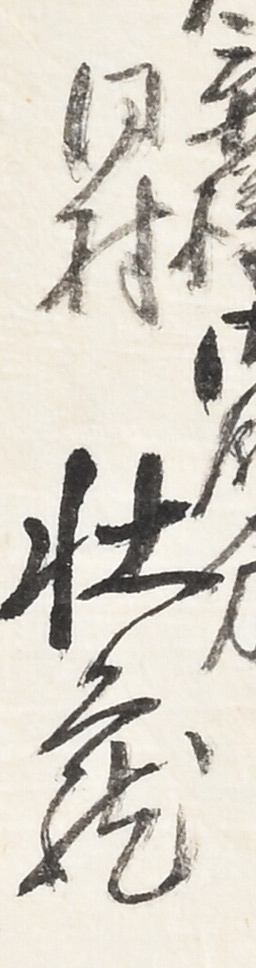同村壮蔵
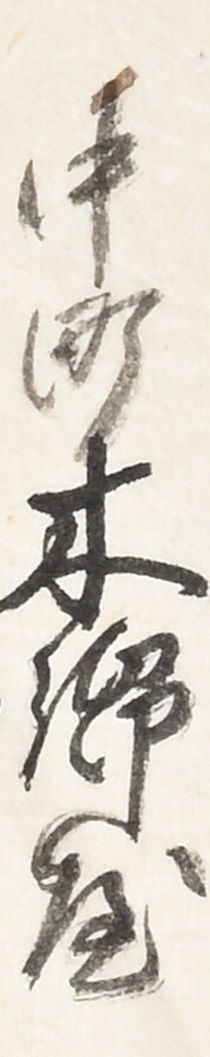中町木綿屋
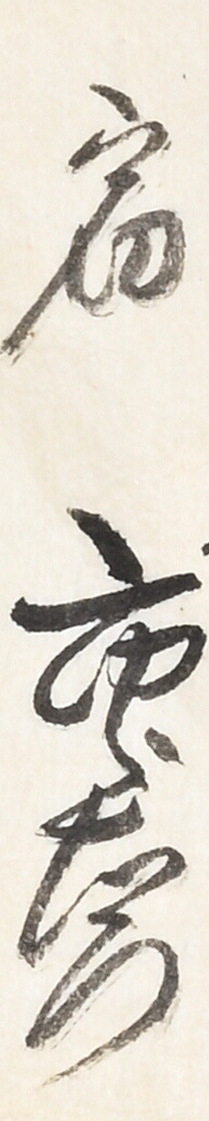宿市郎右衛門
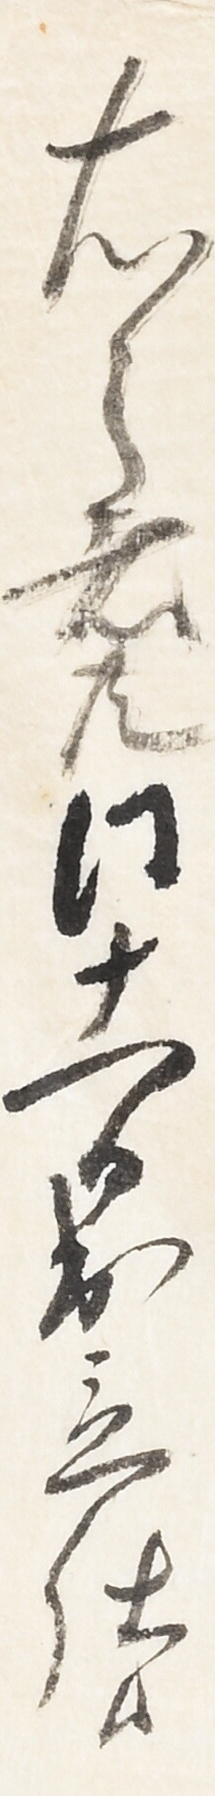右之者共同十一日出立仕候
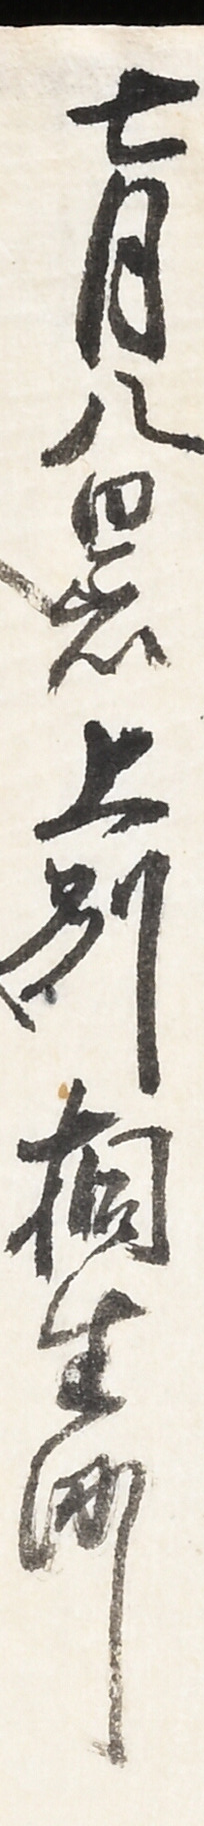七月八日着上州桐生町
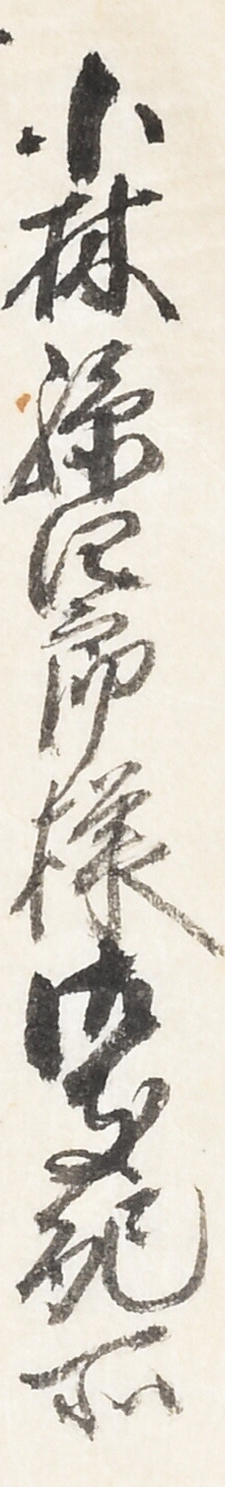小林孫四郎様御支配所
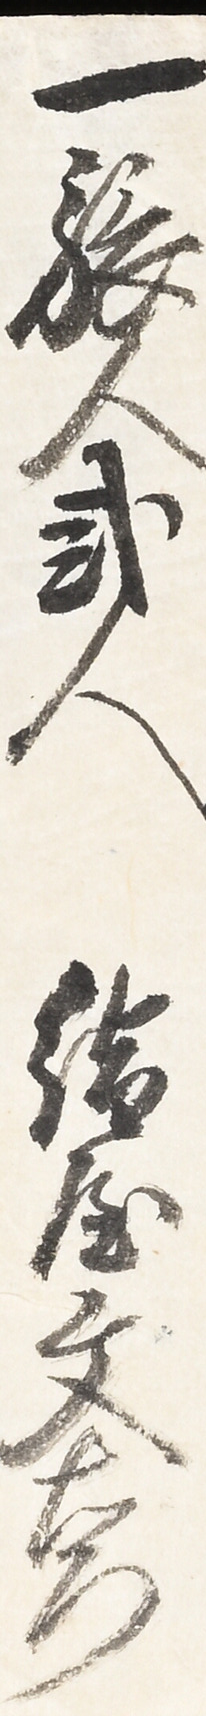一旅人弐人絹屋文右衛門
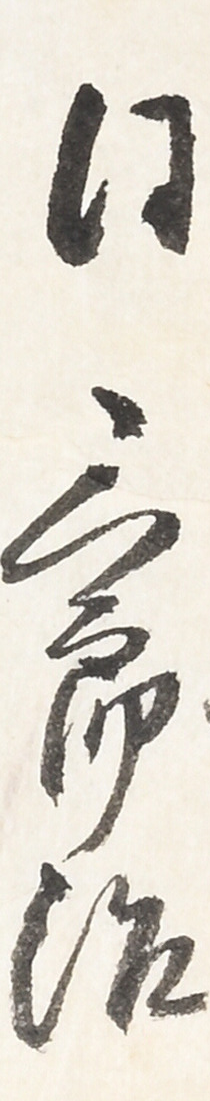同三郎治
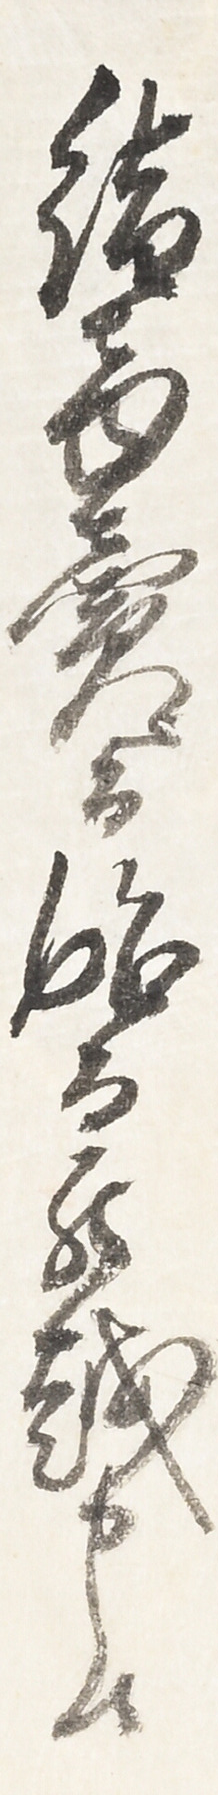絹商売ニ而始而罷越申候
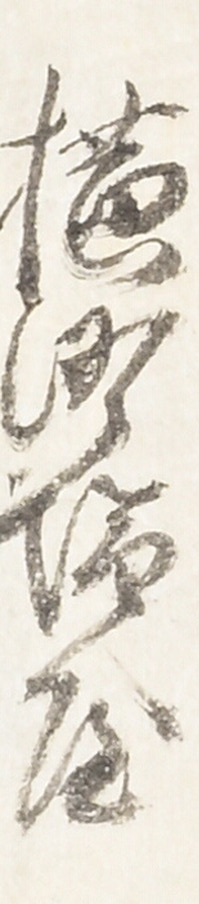横町塩屋
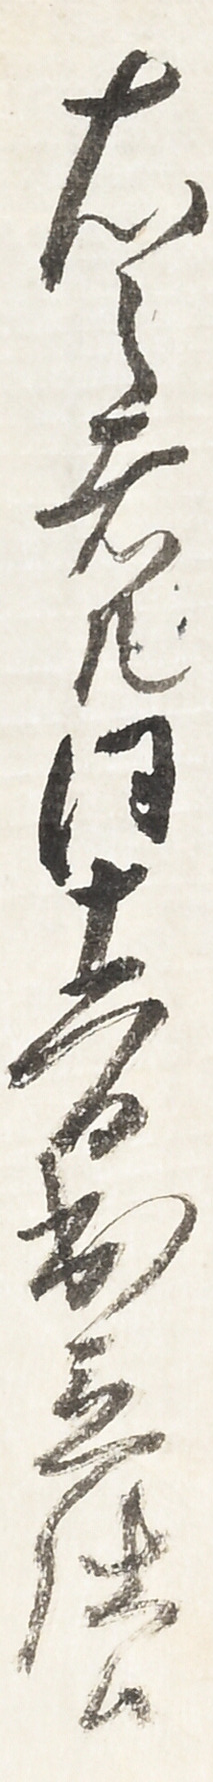右之者共同十二日出立仕候
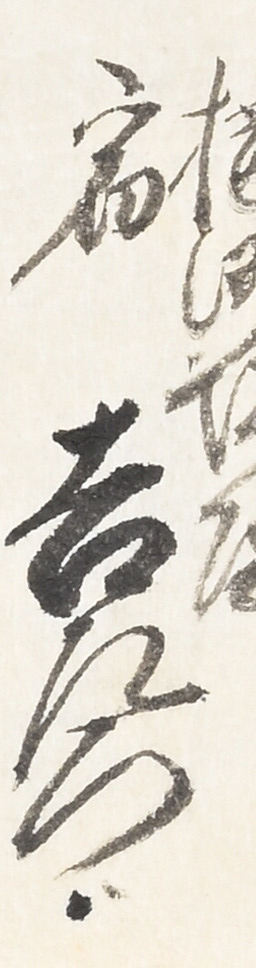宿吉左衛門・
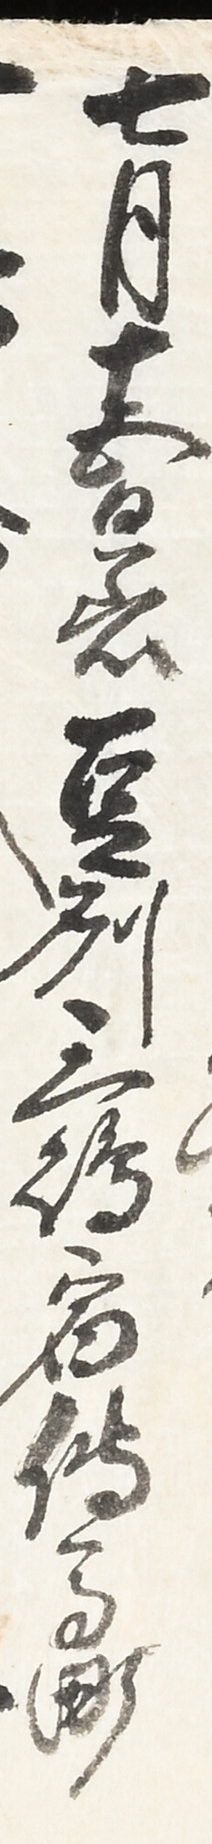七月十五日着豆州三嶋宿伝馬町
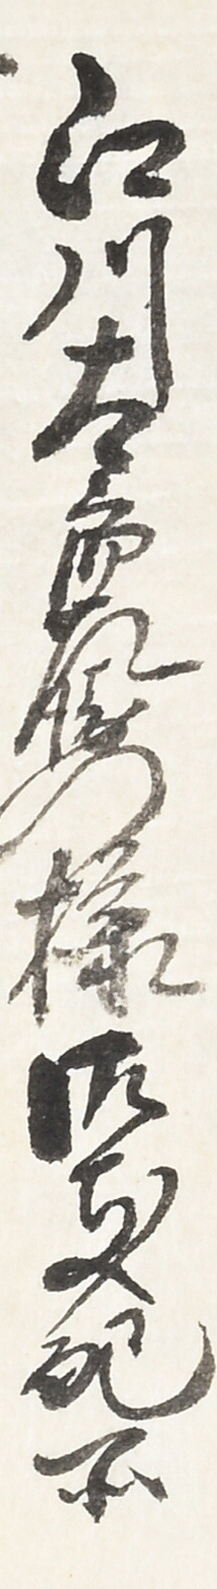江川太郎左衛門様御支配所
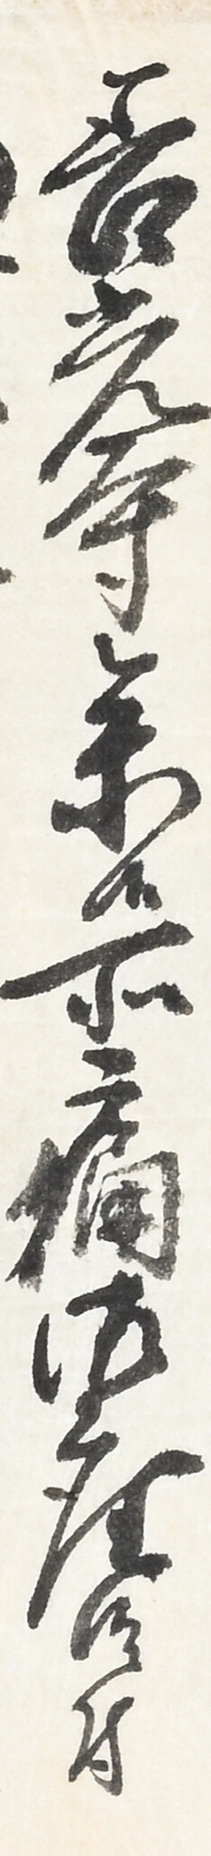善光寺参候所痛御座候付
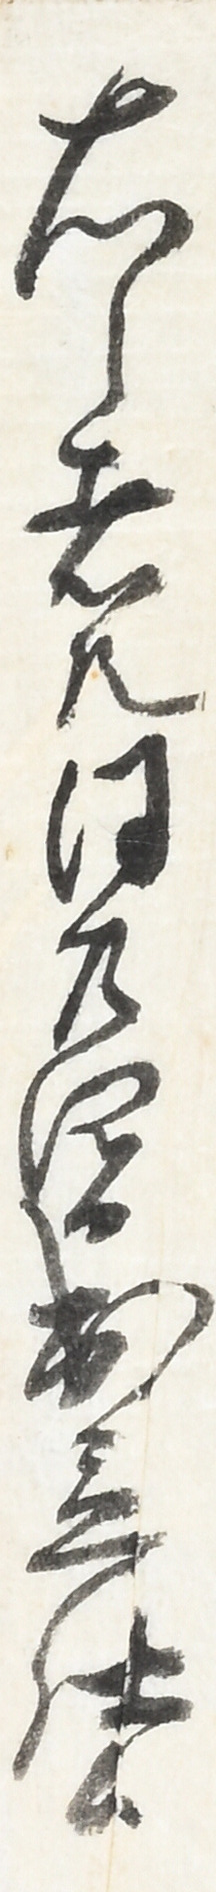右之者共廿四日出立仕候
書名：旅人泊控帳
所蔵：伊那市立高遠町図書館・合同会社AMANE
